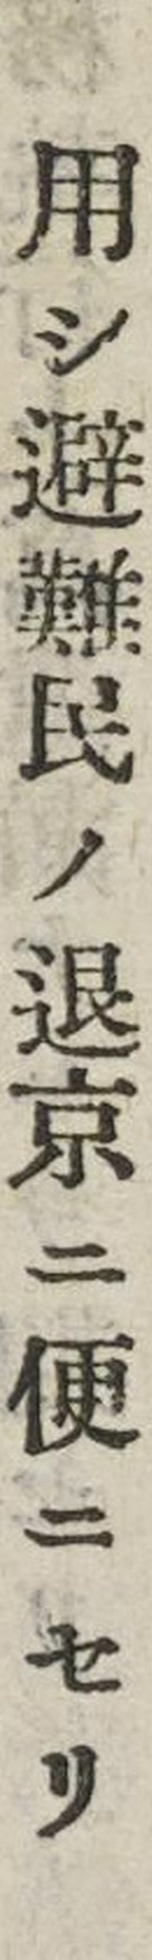用シ避難民ノ退京ニ便ニセリ
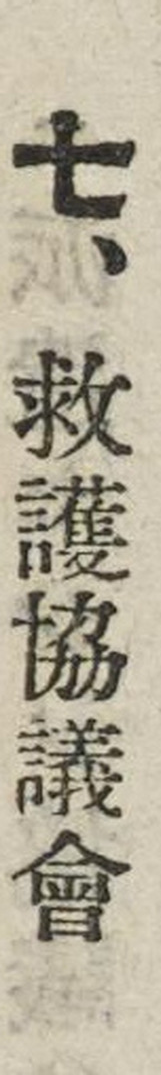七、救護協議会
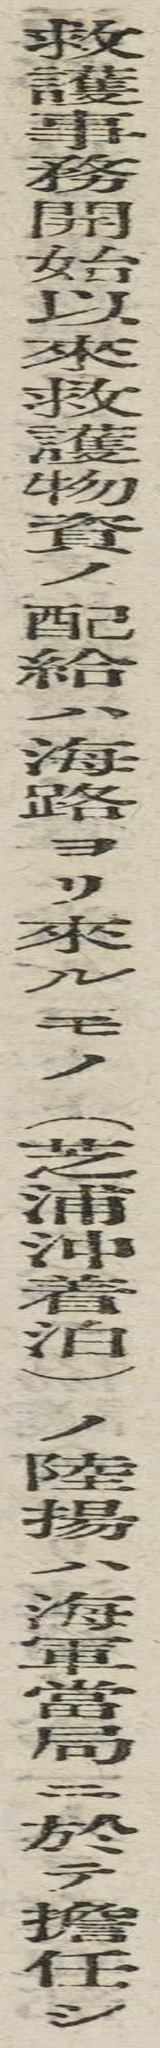救護事務開始以来救護物資ノ配給ハ海路ヨリ来ルモノノ陸揚ハ海軍当局ニ於テ担任シ
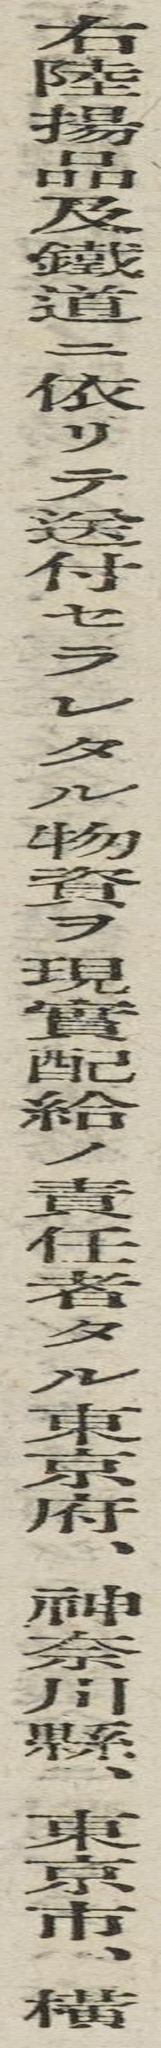右陸揚品及鉄道ニ依リテ送付セラレタル物資ヲ現実配給ノ責任者タル東京府、神奈川県、東京市、横
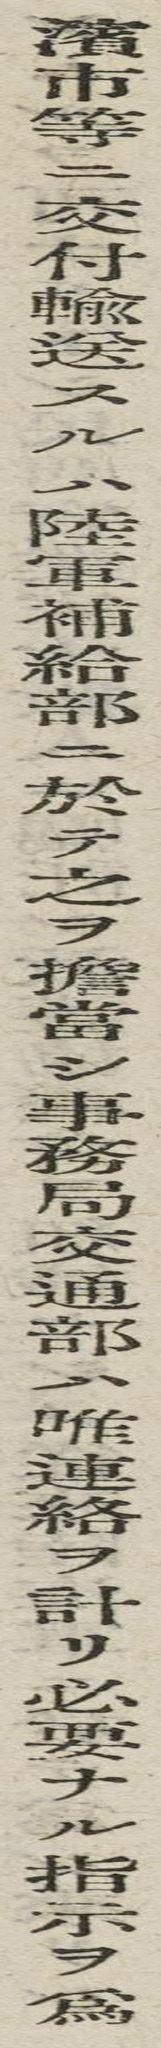浜市等ニ交付輸送スルハ陸軍補給部ニ於テ之ヲ担当シ事務局交通部ハ唯連絡ヲ計リ必要ナル指示ヲ為
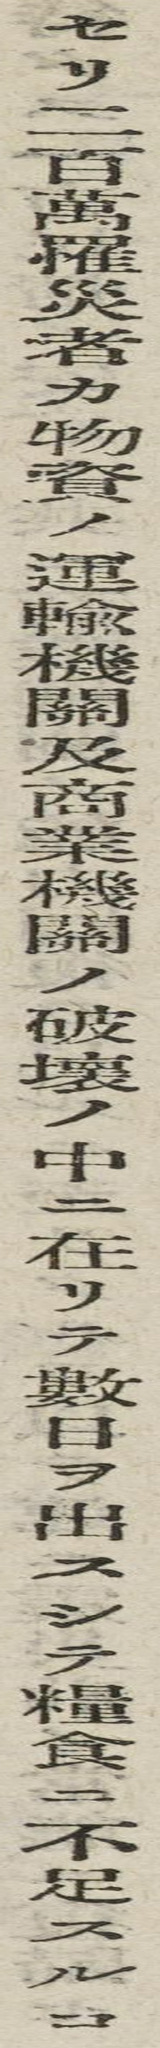セリ二百万罹災者カ物資ノ運輸機関及商業機関ノ破壊ノ中ニ在リテ数日ヲ出スシテ糧食ニ不足スルコ
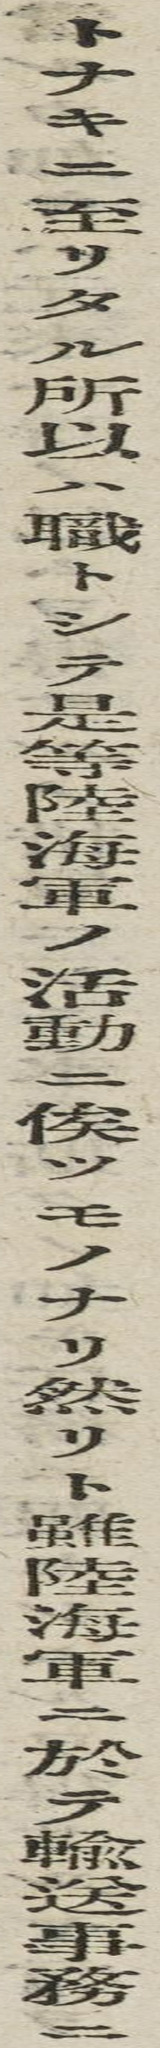トナキニ至リタル所以ハ職トシテ是等陸海軍ノ活動ニ俟ツモノナリ然リト雖陸海軍ニ於テ輸送事務ニ

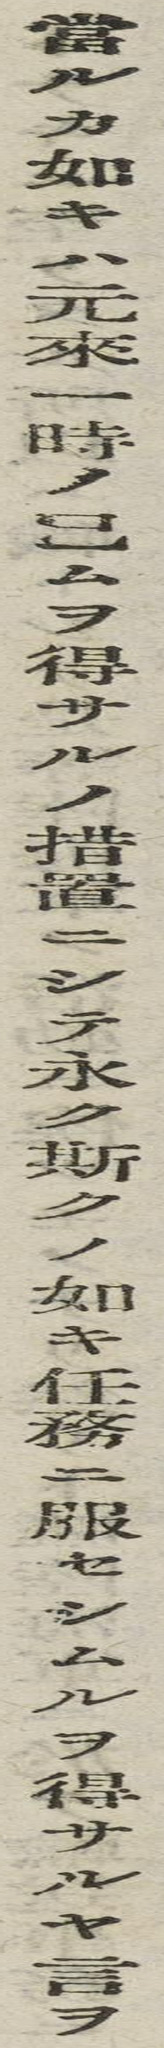当ルカ如キハ元来一時ノ已ムヲ得サルノ措置ニシテ永ク斯クノ如キ任務ニ復セシムルヲ得サルヤ言ヲ
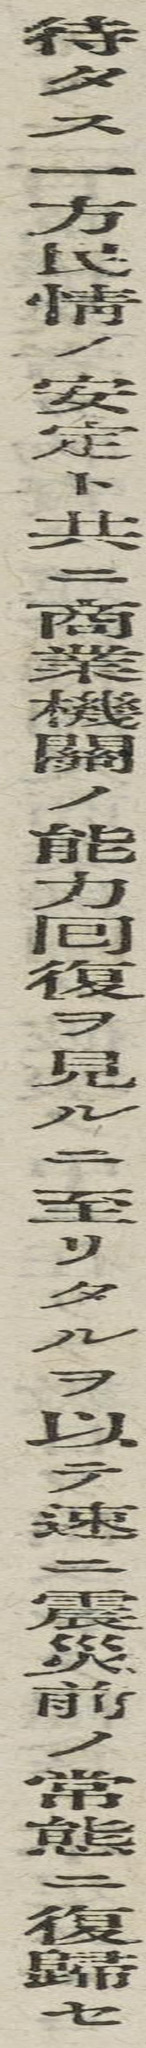待タス一方民情ノ安定ト共ニ商業機関ノ能力回復ヲ見ルニ至リタルヲ以テ速ニ震災前ノ常態ニ復帰セ
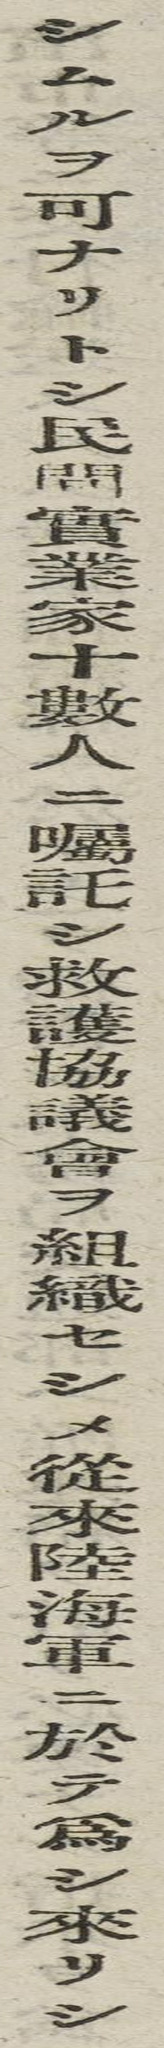シムルヲ可ナリトシ民間実業家十数人ニ嘱託シ救護協議会ヲ組織セシメ従来陸海軍ニ於テ為シ来リシ
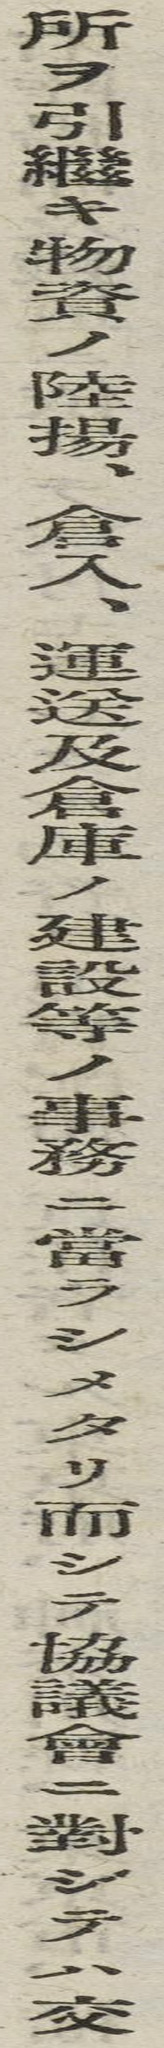所ヲ引継キ物資ノ陸揚、倉入、運送及倉庫ノ建設等ノ事務ニ当ラシメタリ而シテ協議会ニ対シテハ交
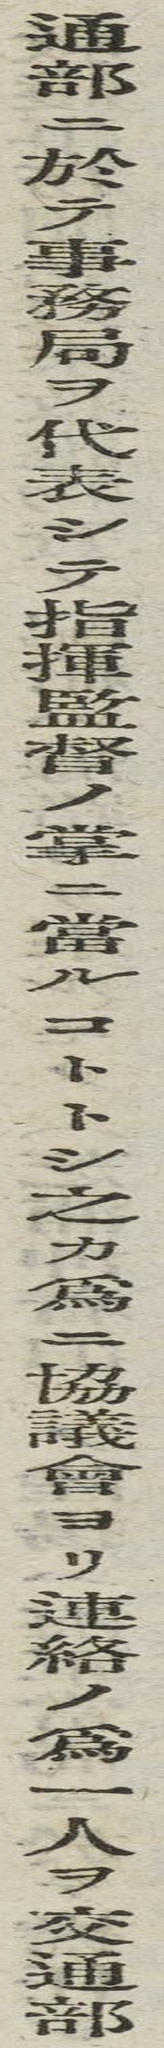通部ニ於テ事務局ヲ代表シテ指揮監督ノ掌ニ当ルコトトシ之カ為ニ協議会ヨリ連絡ノ為一人ヲ交通部
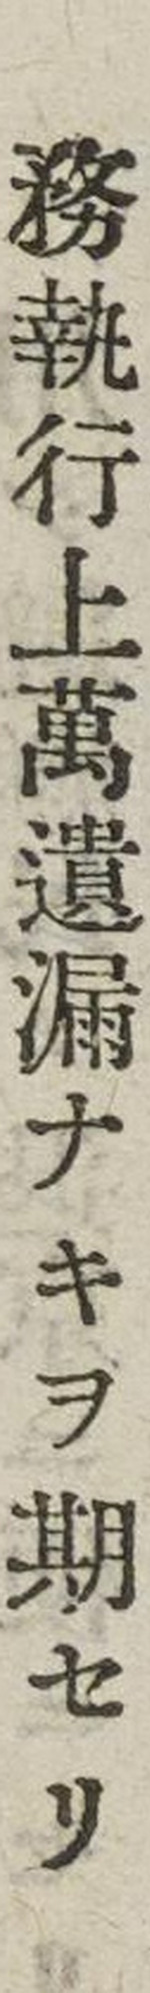務執行上万遺漏ナキヲ期セリ
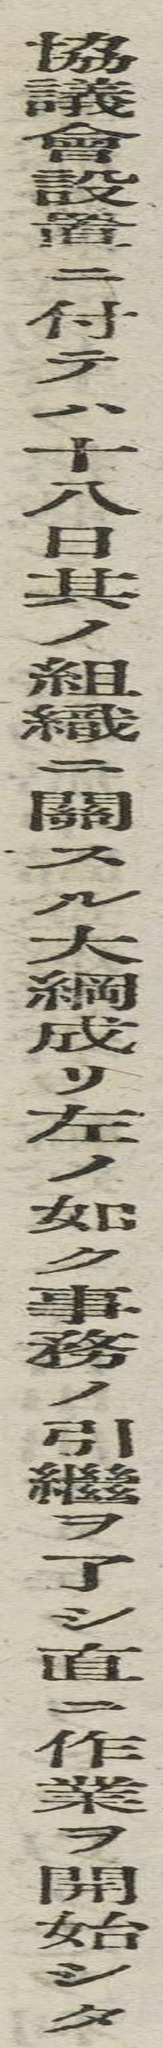協議会設置ニ付テハ十八日其ノ組織ニ関スル大綱成リ左ノ如ク事務ノ引継ヲ了シ直ニ作業ヲ開始シタ
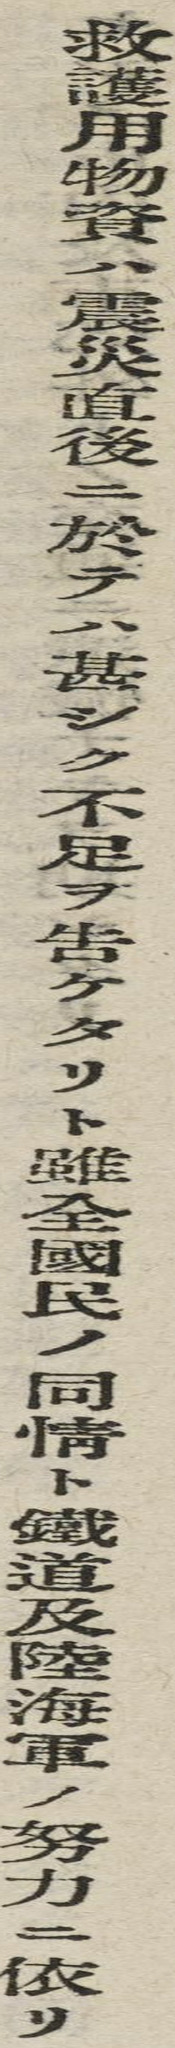救護用物資ハ震災直後ニ於テハ甚シク不足ヲ告ケタリト雖全国民ノ同情ト鉄道及陸海軍ノ努力ニ依リ
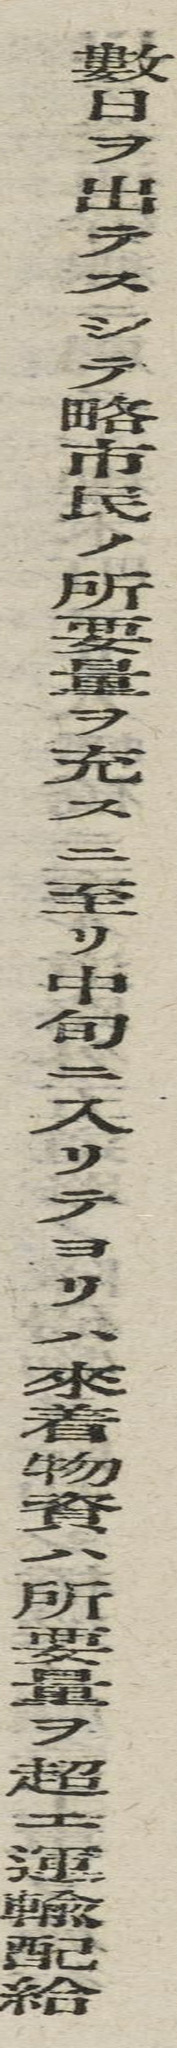数日ヲ出テスシテ略市民ノ所要量ヲ充スニ至リ中旬ニ入リテヨリハ来着物資ハ所要量ヲ超エ運輸配給
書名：震災被害状況並救護施設概要
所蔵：東京大学地震研究所図書室 Earthquake Research Institute Library, The University of Tokyo, JAPAN
